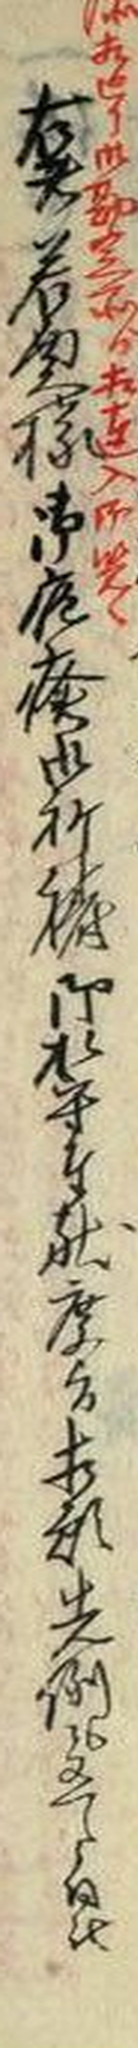右者若殿様御疱瘡御祈祷御札守奉献度旨相願先例も有之ニ付被

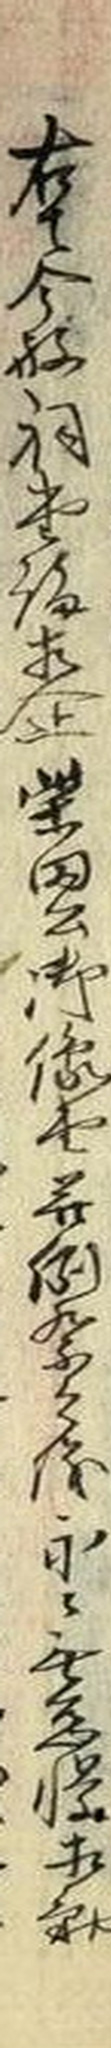右は今般祠堂講相企柴田公御像堂并例祭之儀永々無怠慢相勤
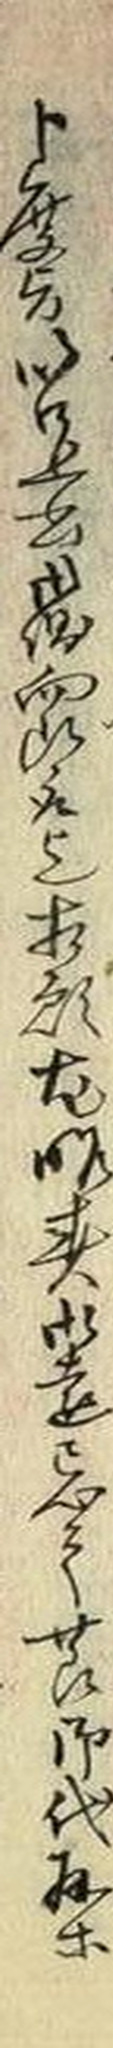申度旨以口上書御側向頭取迄相願尤昨春御遠忌之節御代拝等
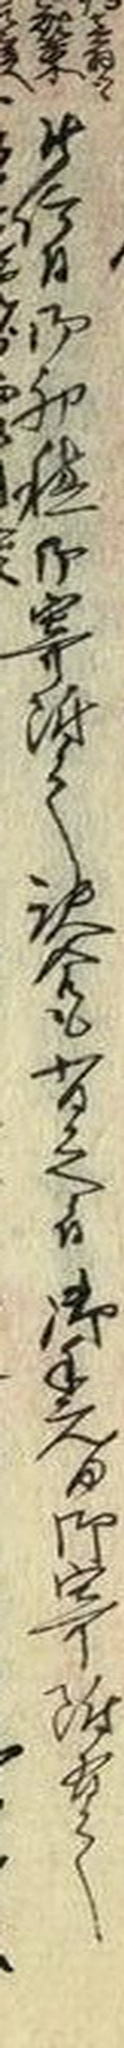被仰付御初穂御寄附之訳合も有之ニ付御手元ゟお御寄附有之
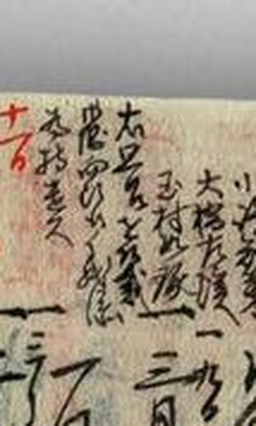右思召を頂戴
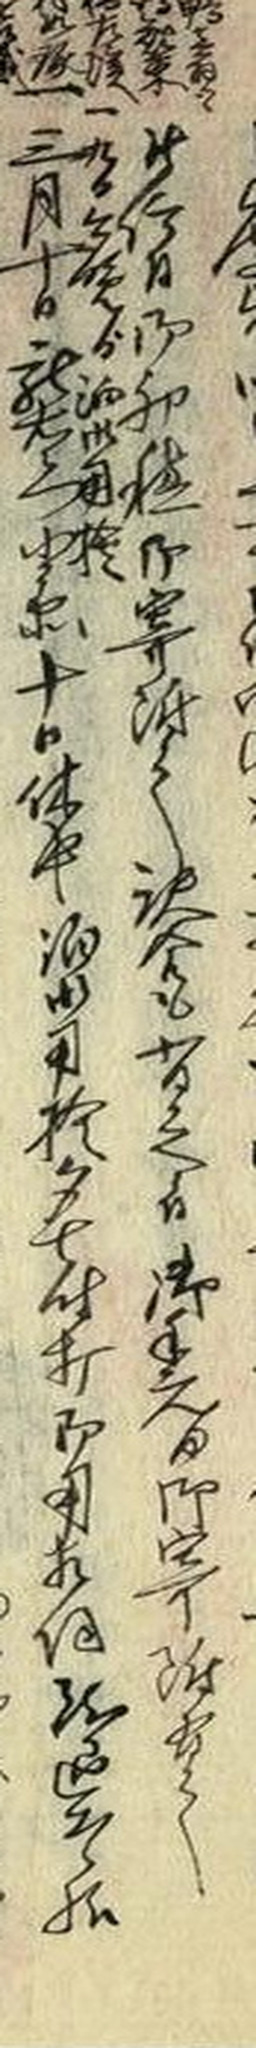一三月十日新右衛門小兵衛十日休中泊御用捨夕七時打御用相伺致退出候様
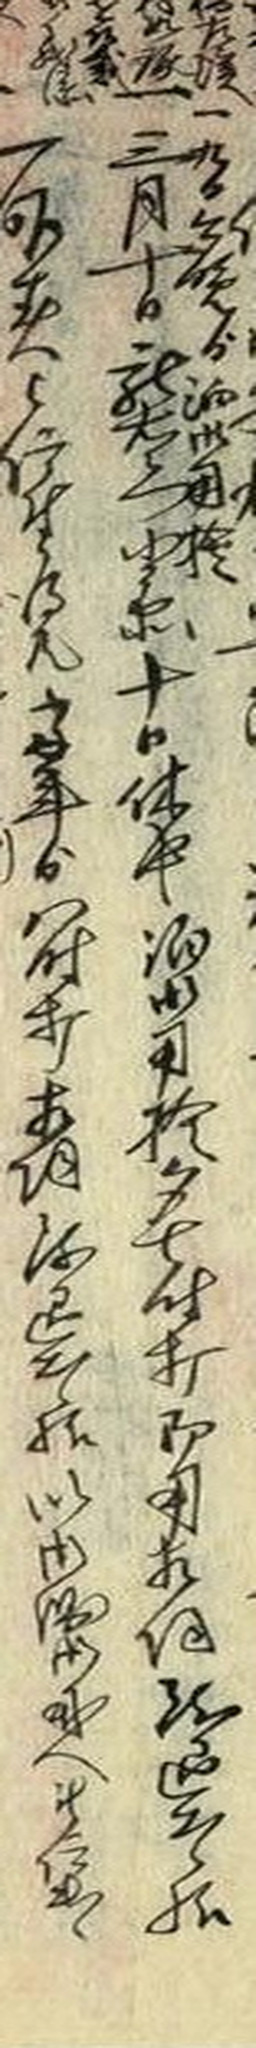一昨春被仰付候得共当年ゟ八時打相伺致退出候様以御側御用人被仰出候
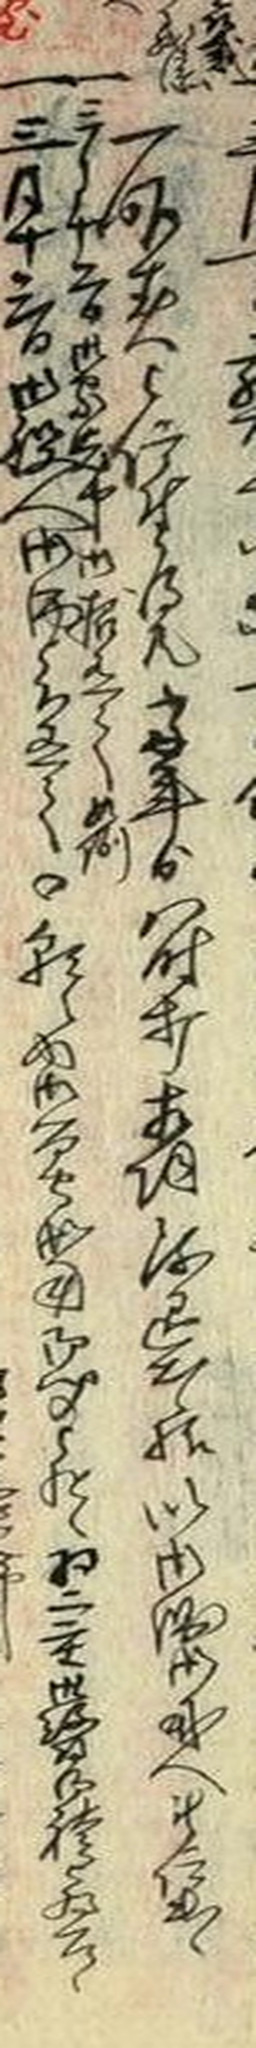一三月十三日御役人御酒被下有之〇朝之内御留守御用御聞被遊候羽二重御紋付御絝被為召候
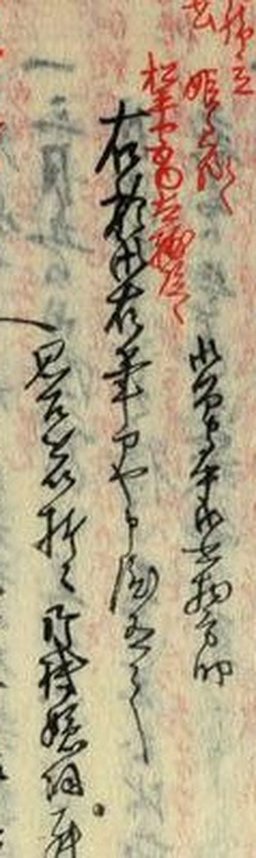右於御右筆部や申渡有之
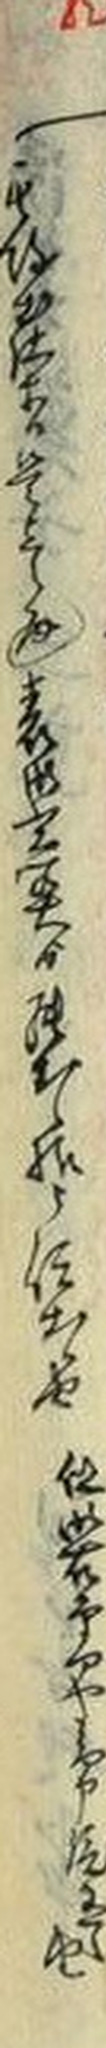其餘出仕等ハ是迄之通表御玄関ゟ罷出候様被仰出候由但御右筆部やニ而申渡有之由
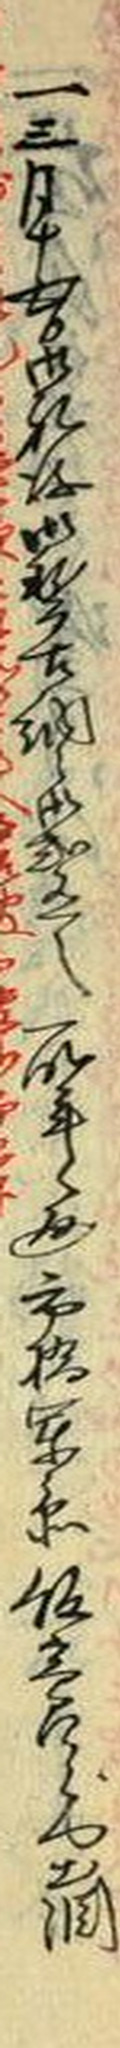一三月十五日御礼後御稽古納之御式有之一昨年之通市橋軍兵衛飯嶋四郎左衛門出渕
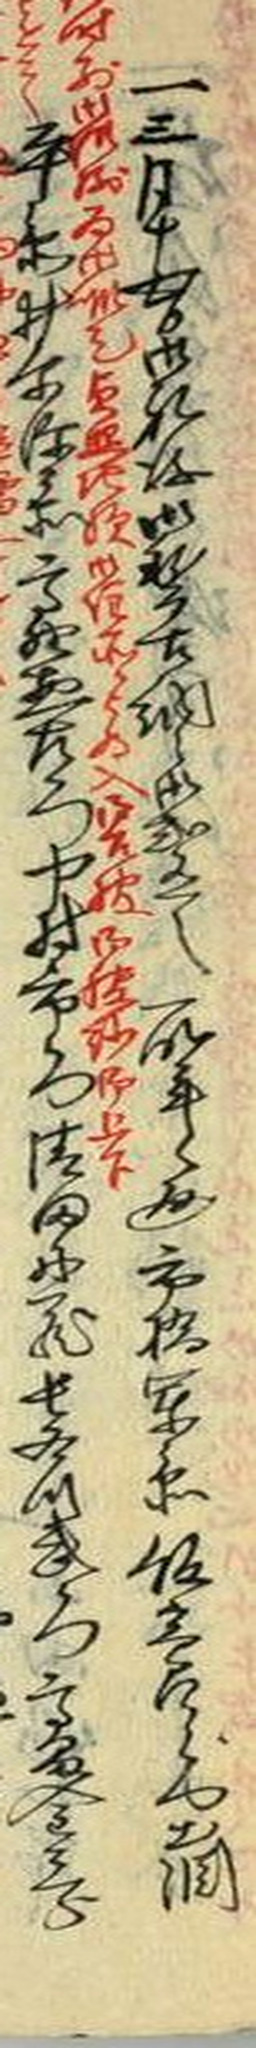平兵衛井原源兵衛高野惣左衛門中村市右衛門清田丹蔵長谷川武右衛門高畠金三郎
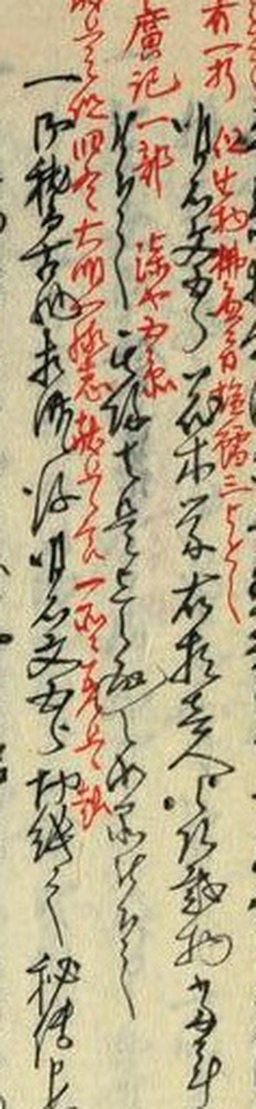被下之其餘は是迄之通之御品被下之
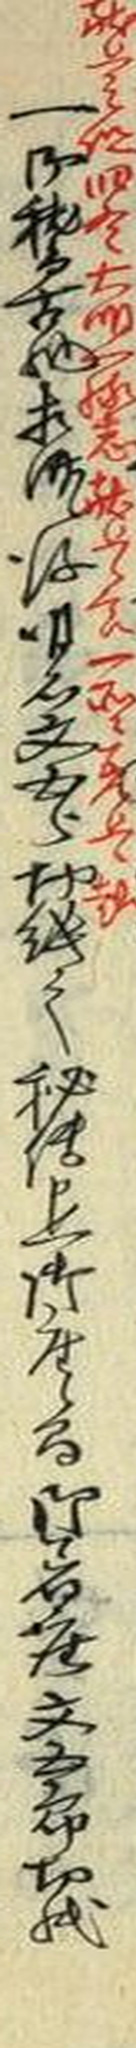一御稽古納相済候後明石文五郎切紙之秘伝申上御座之間御着座文五郎切紙
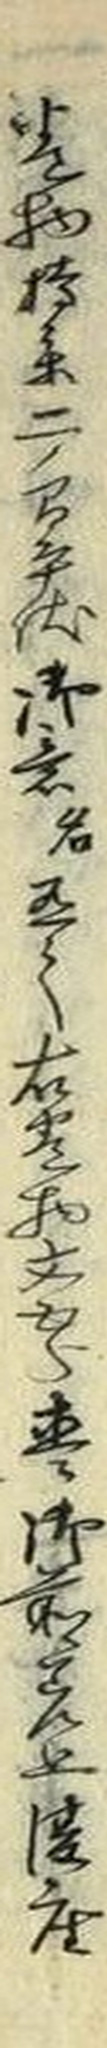巻物持参二之間平伏御意名有之右巻物文五郎直々御前へ差上復座
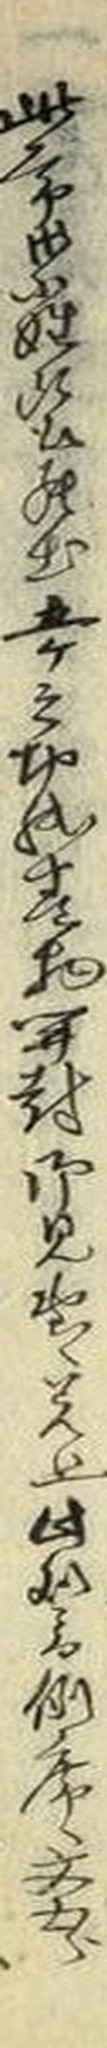此節御小姓頭取罷出五ヶ之切紙巻物開封御見台へ差上此処ニ而例席へ文五郎
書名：少傅日録抄（斉承付側向頭取日記、在国）
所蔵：福井県文書館 Fukui Prefectural Archives
